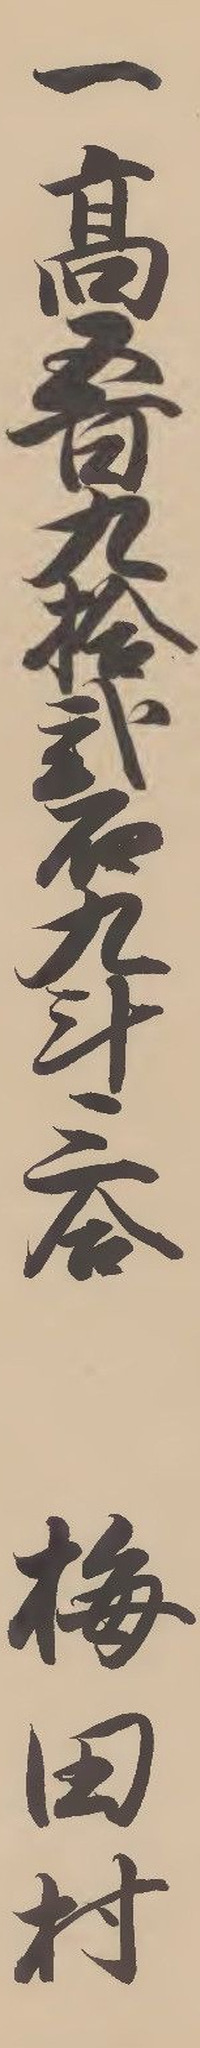一高五百九拾弐石九斗三合梅田村
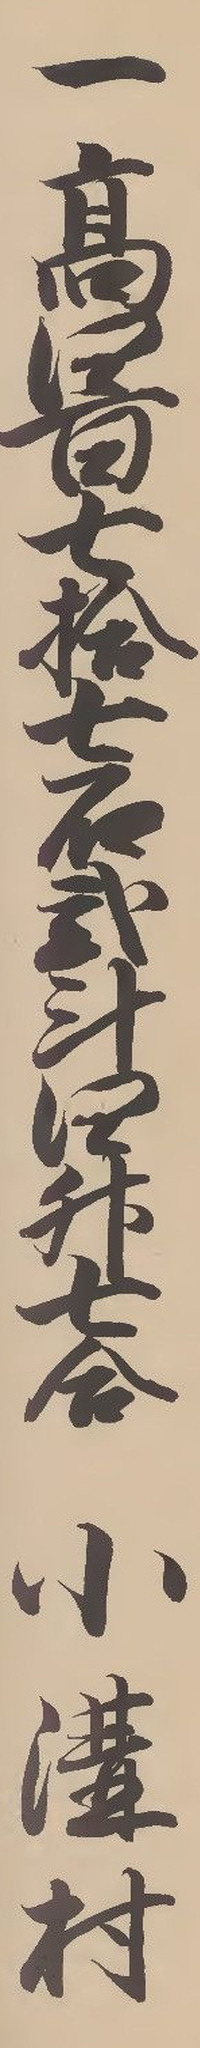一高四百七拾七石弐斗四升七合小溝村
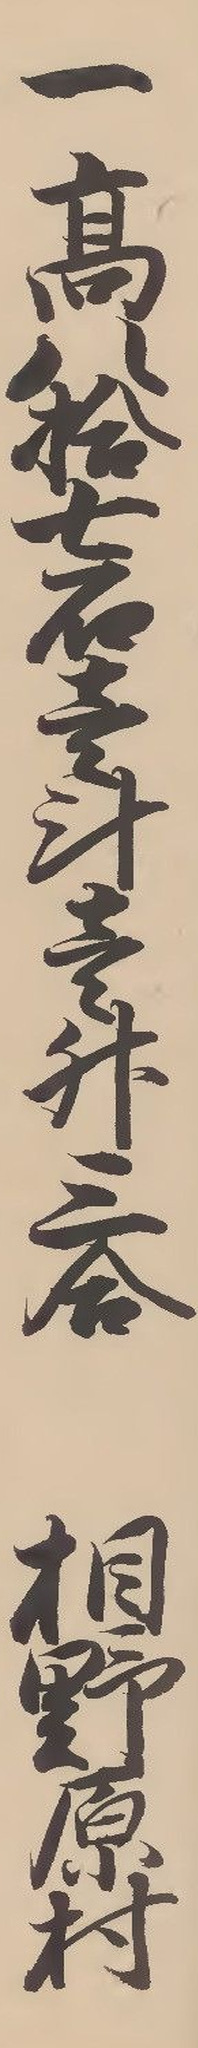一高八拾七石壱斗壱升三合相野原村
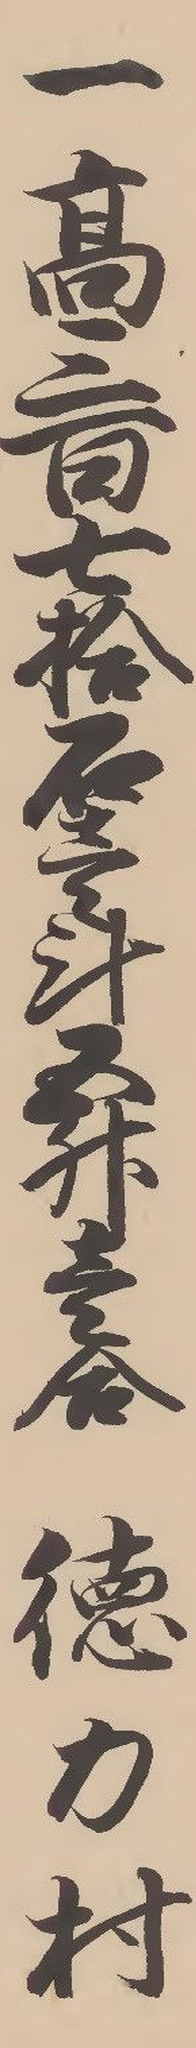一高三百七拾石壱斗五升壱合徳力村
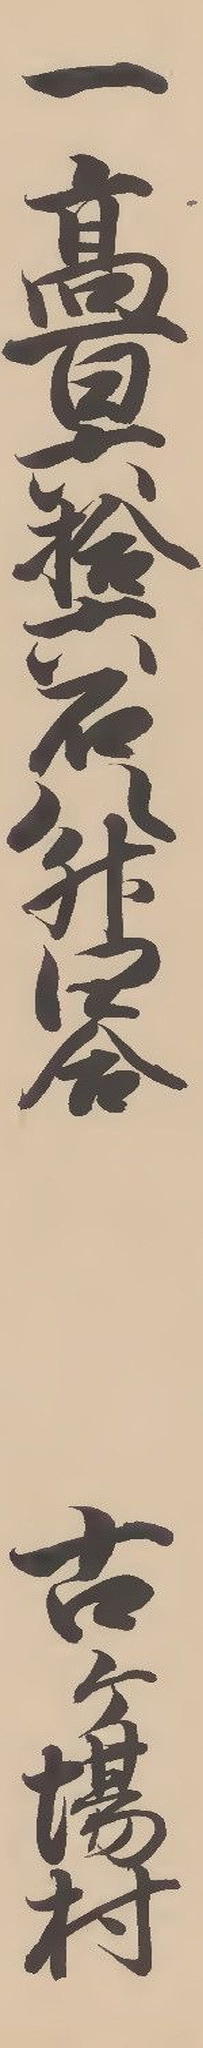一高百六拾六石八升四合古ヶ場村
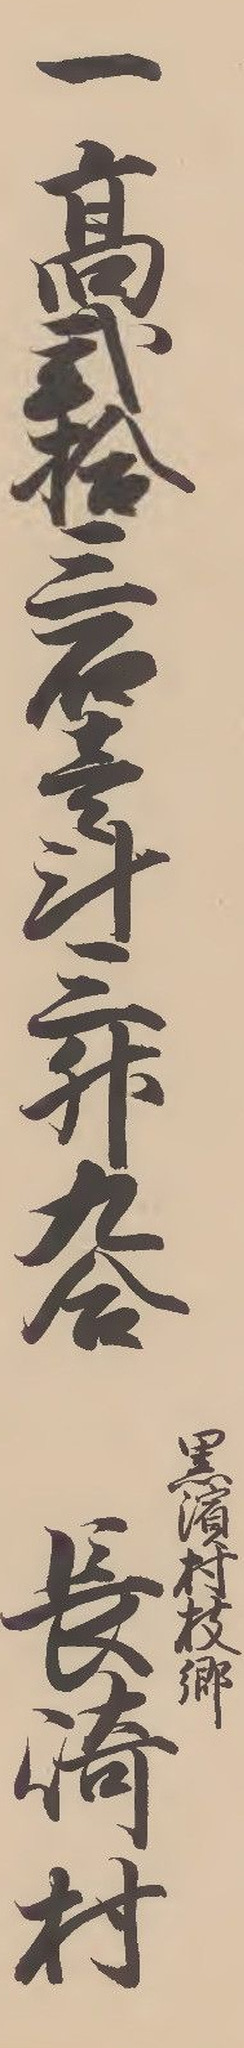一高弐拾三石壱斗三升九合長崎村

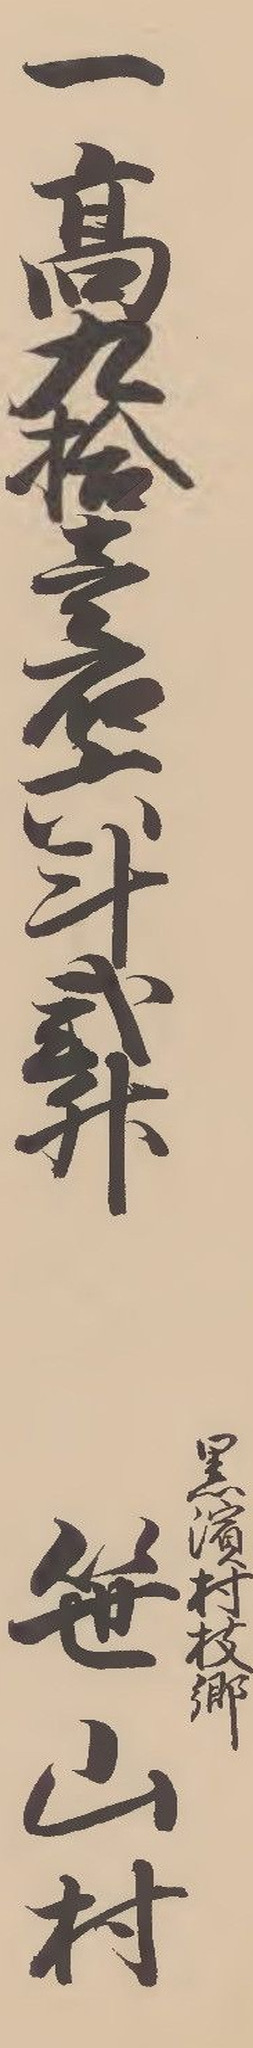一高九拾壱石六斗弐升笹山村
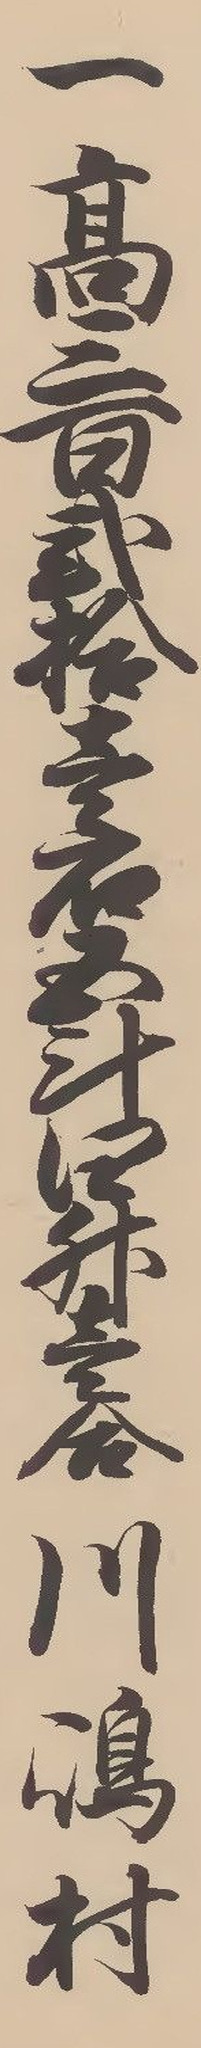一高三百弐拾壱石五斗四升壱合川嶋村
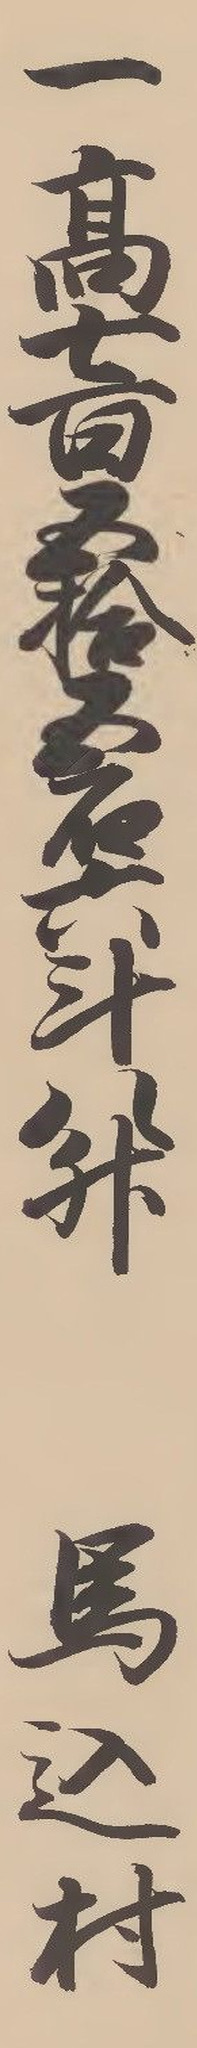一高七百五拾五石六斗八升馬込村
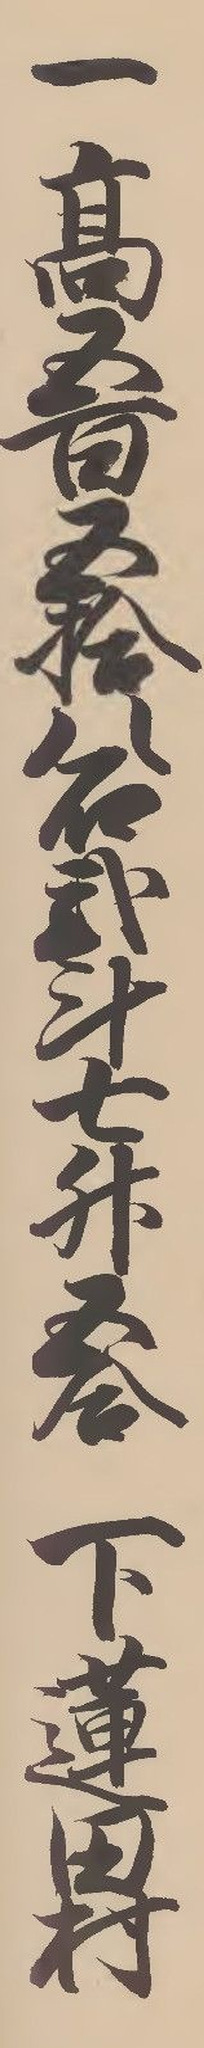一高五百五拾八石弐斗七升五合下蓮田村
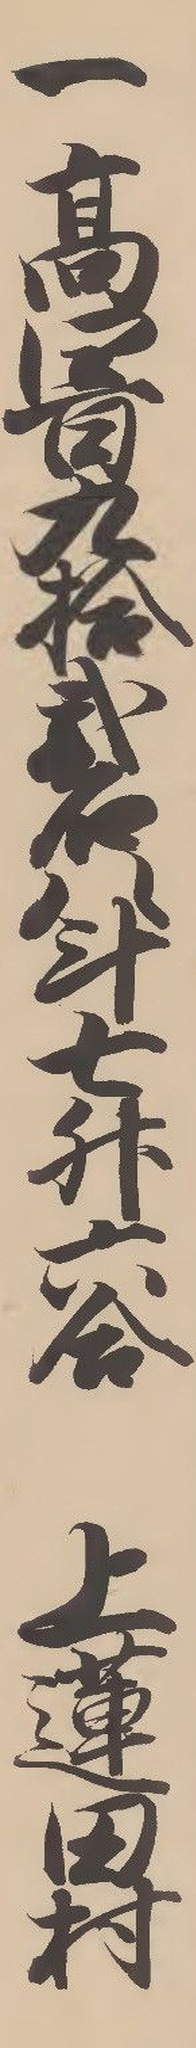一高四百九拾弐石八斗七升六合上蓮田村
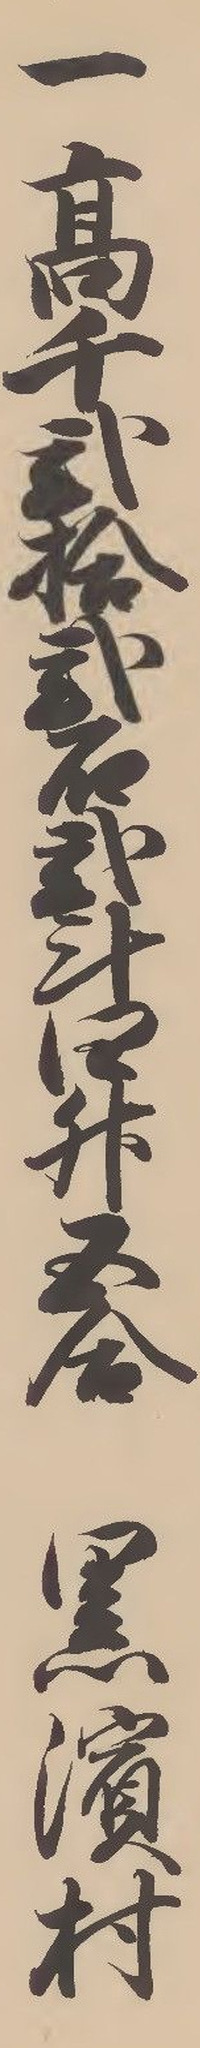一高千弐拾弐石弐斗四升五合黒濱村
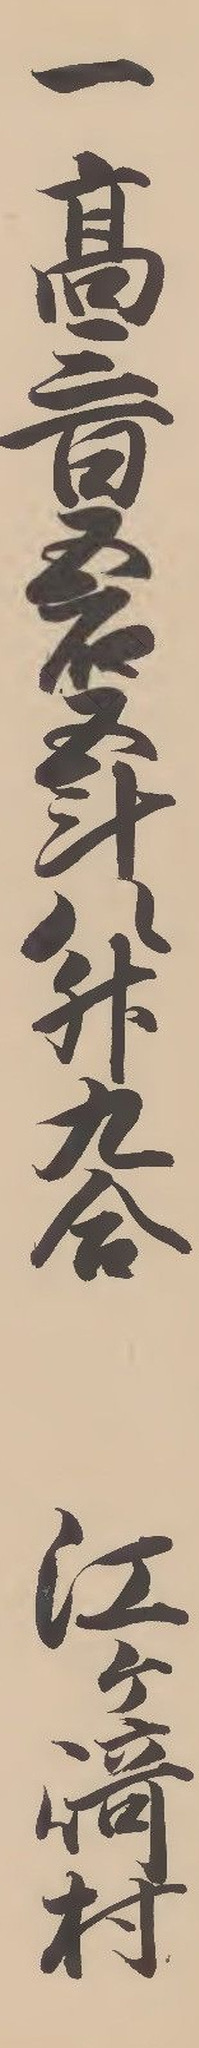一高三百五石五斗八升九合江ヶ崎村
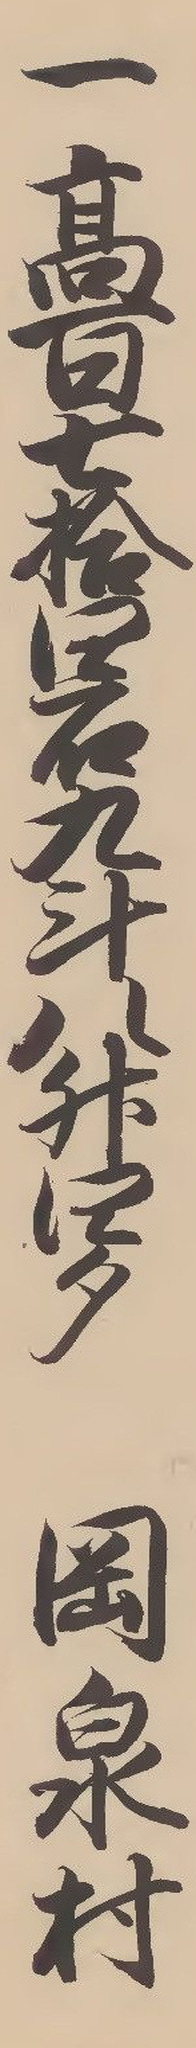一高百七拾四石九斗八升四勺岡泉村

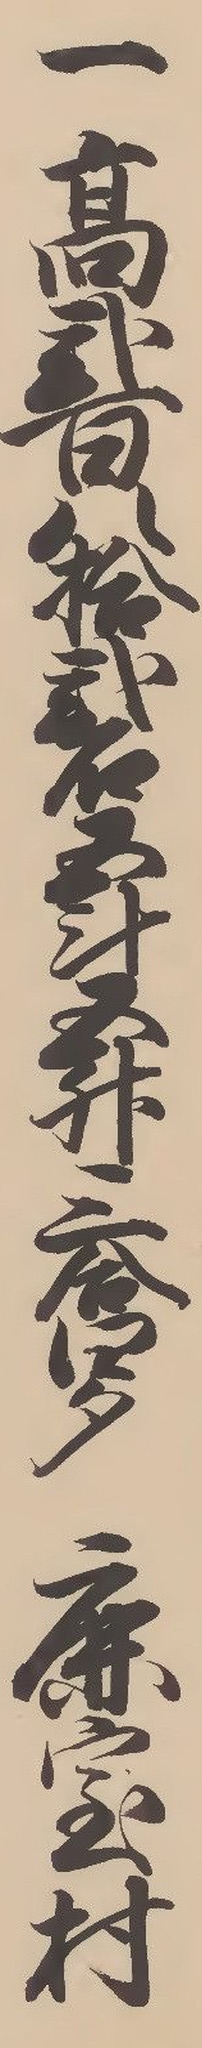一高弐百八拾弐石五斗五升三合四勺鹿室村
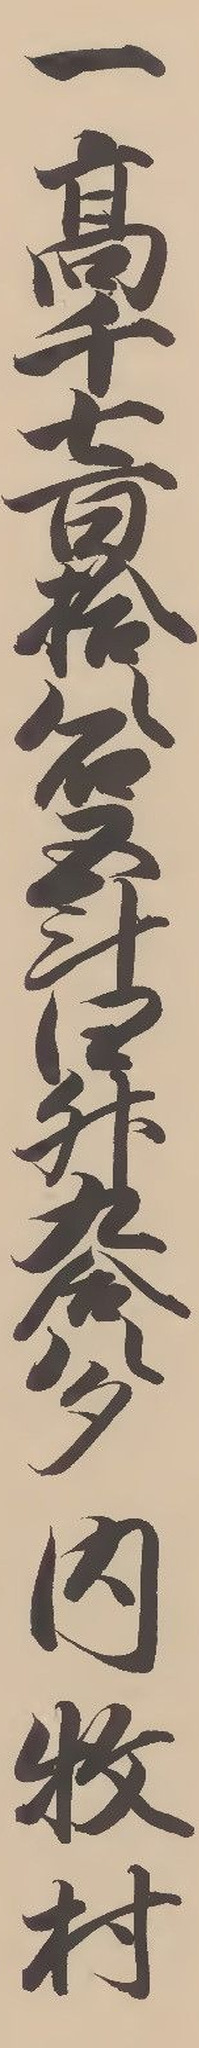一高千七百拾八石五斗四升九合八勺内枚村
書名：武蔵国郷帳　下
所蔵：国立公文書館 National Archives of Japan
